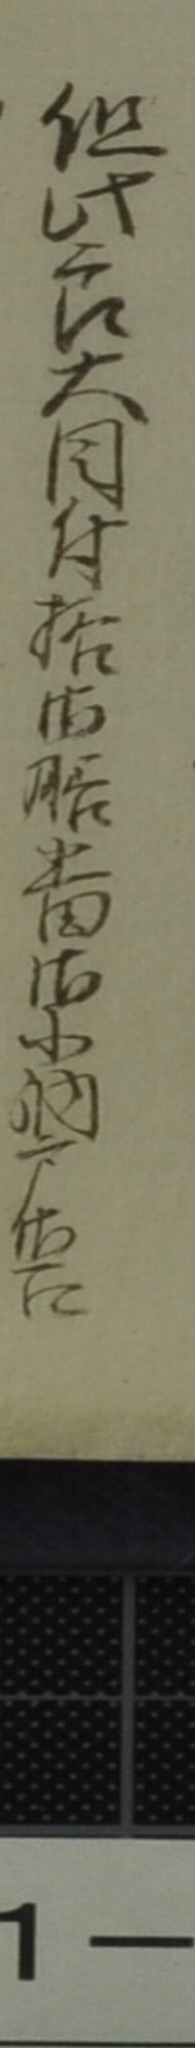但此節大目付格御膳番御小納戸御召
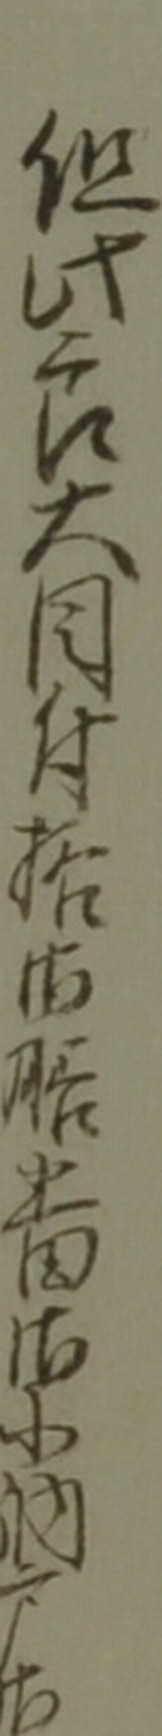但此節大目付格御膳番御小納戸御召
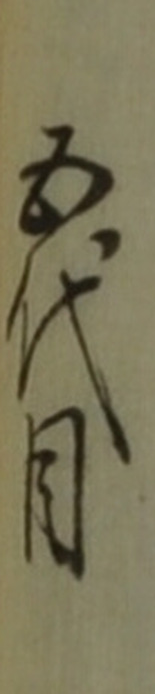五代目
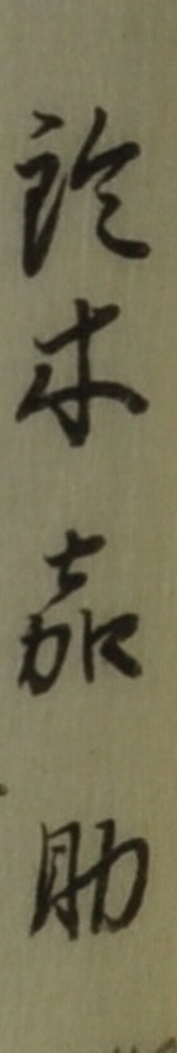鈴木嘉助
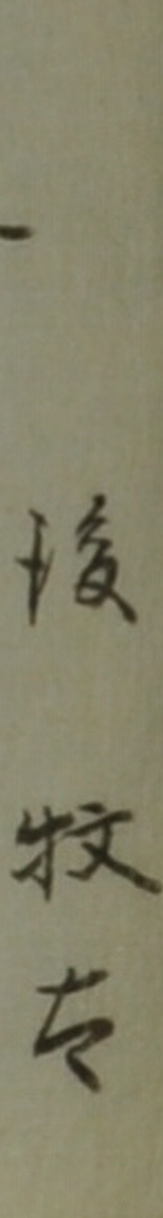後牧太
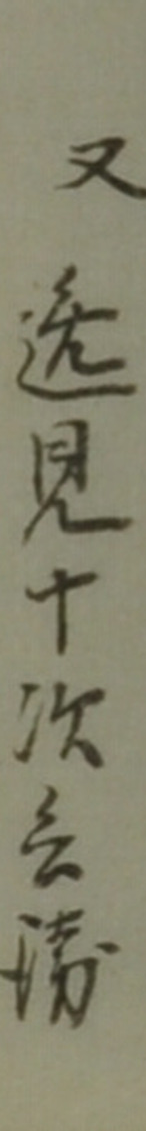又逸見十次兵衛
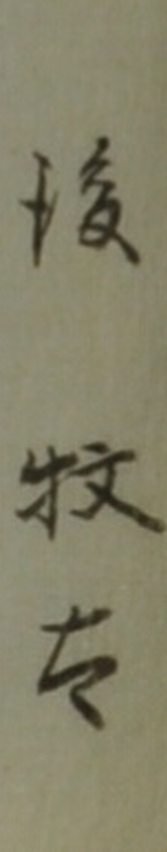後牧太
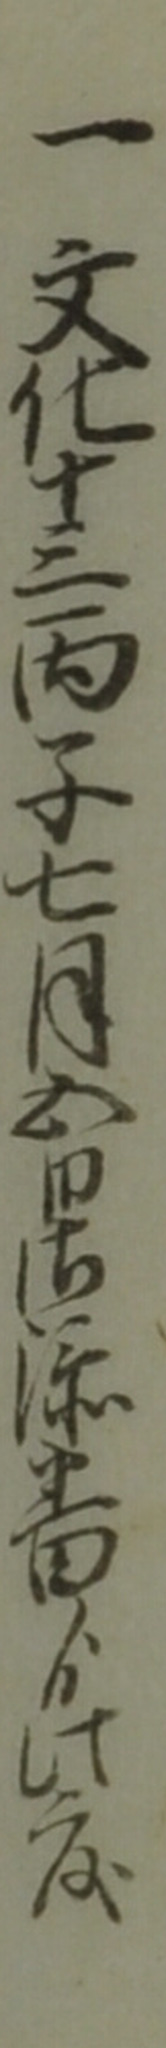一文化十三丙子七月五日御添番ゟ此度
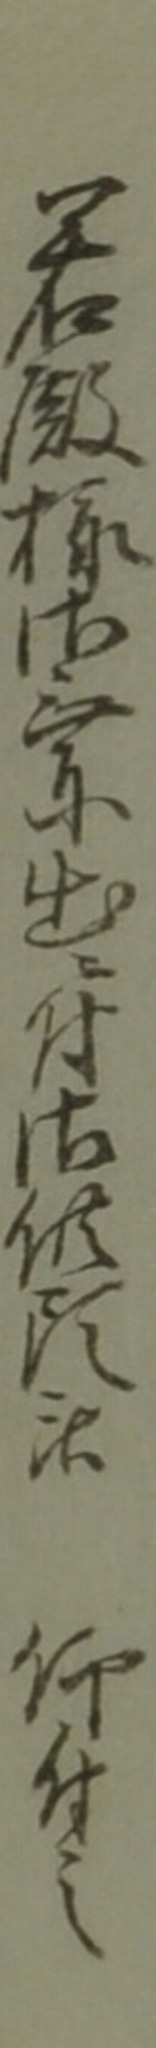若殿様御乗出ニ付御供頭被仰付之
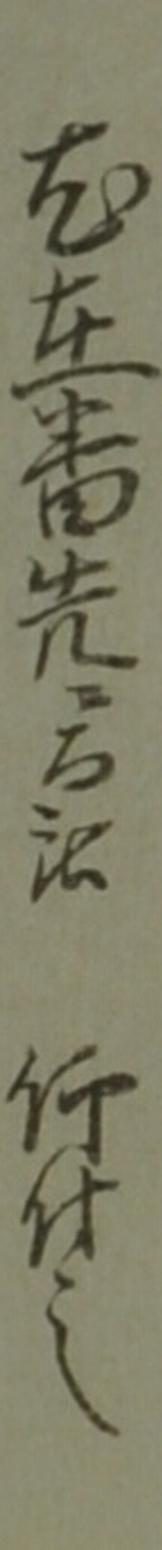尤在番先ニ而被仰付之
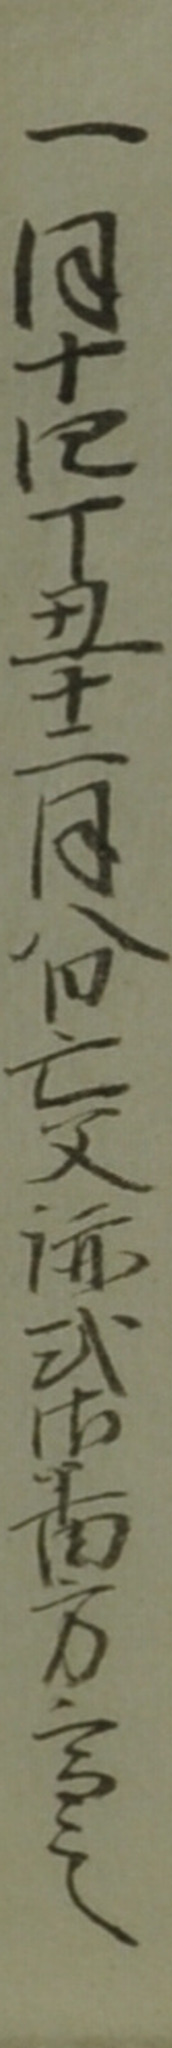一同十四丁丑十二月八日亡父跡式御番方高之
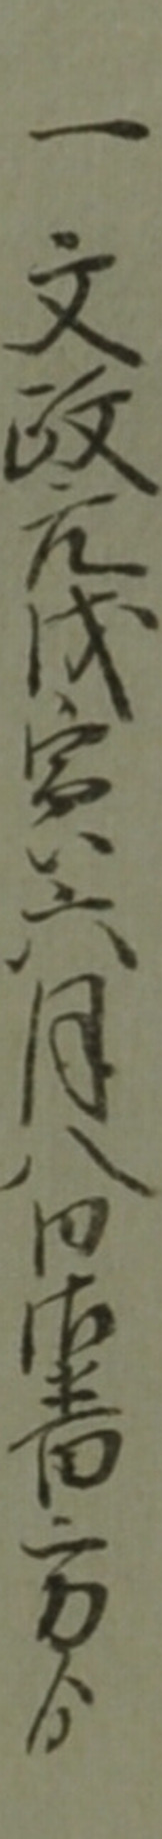一文政元戊寅六月八日御番方ゟ
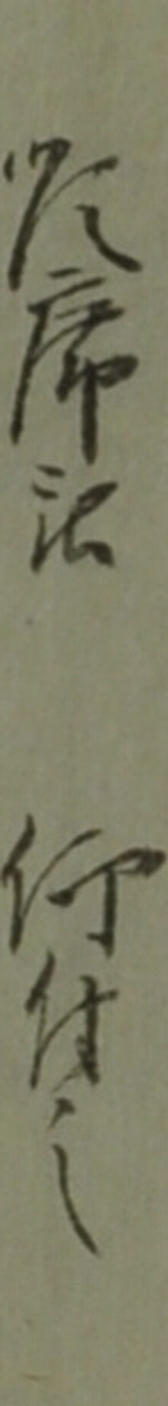順席被仰付之
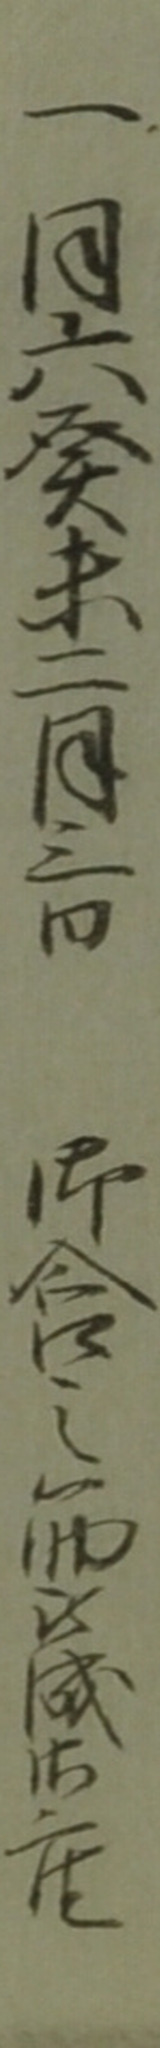一同六癸未二月三日御含之筋被成御座
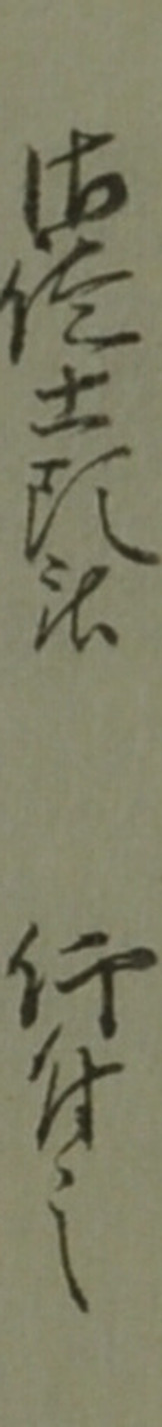御徒士頭被仰付之
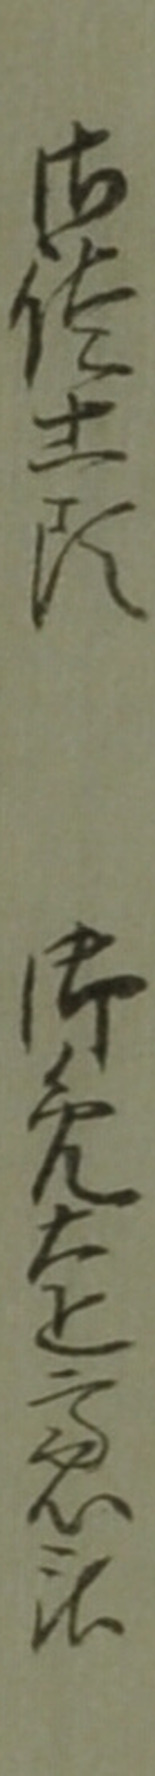御徒士頭御免遠慮被
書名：諸御役代々録（六）
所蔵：伊那市立高遠町図書館・合同会社AMANE
